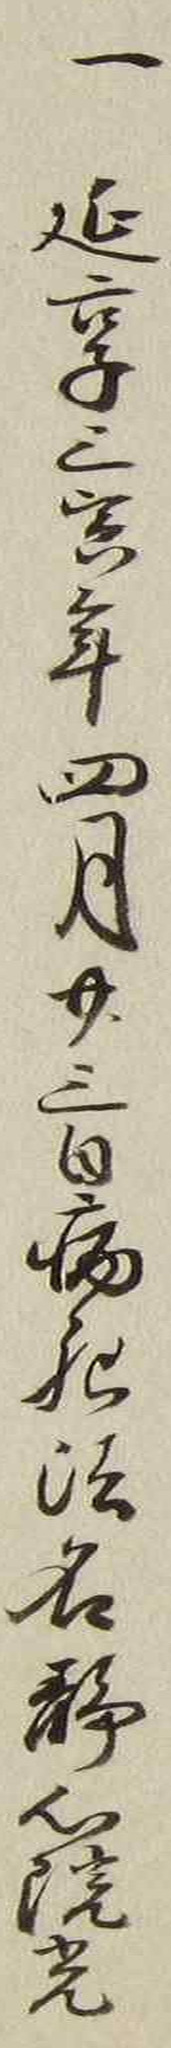一延享三寅年四月廿三日病死法名静心院光
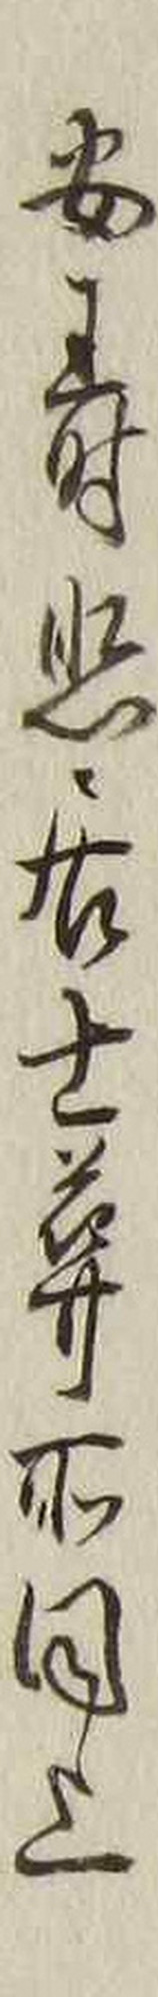安寿照居士葬所同上

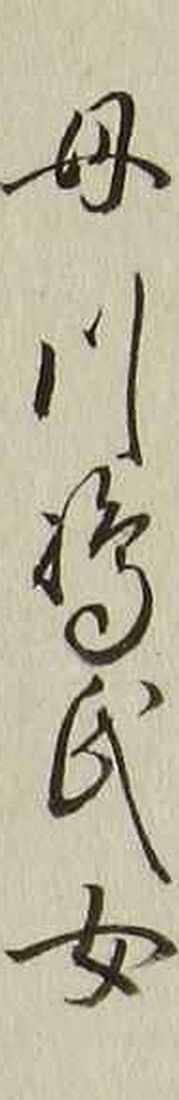母川嶋氏女
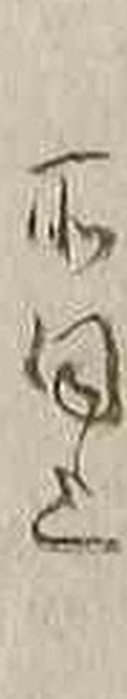母同上
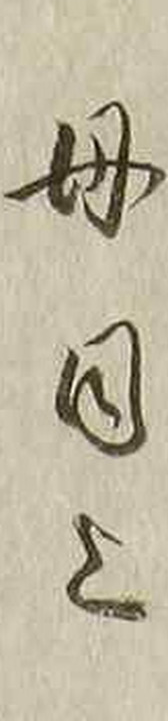母同上
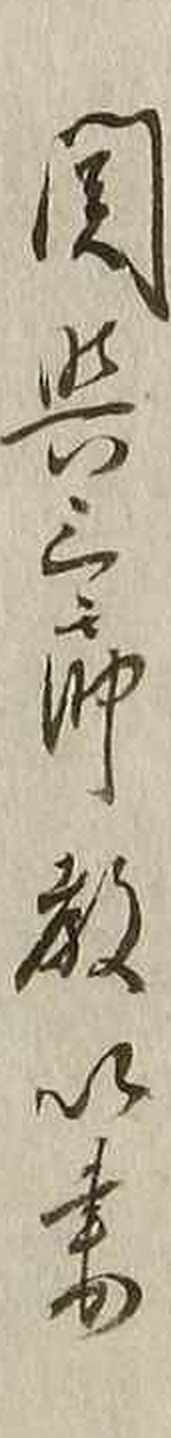女関与三郎教以妻
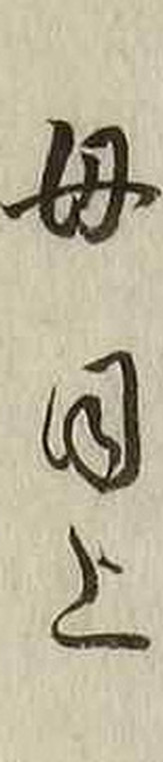母同上
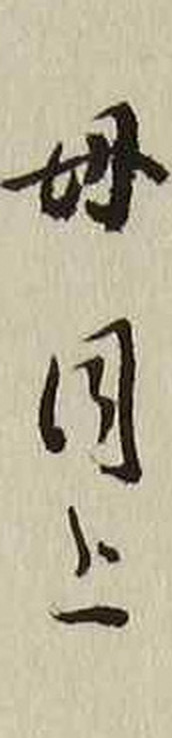母同上
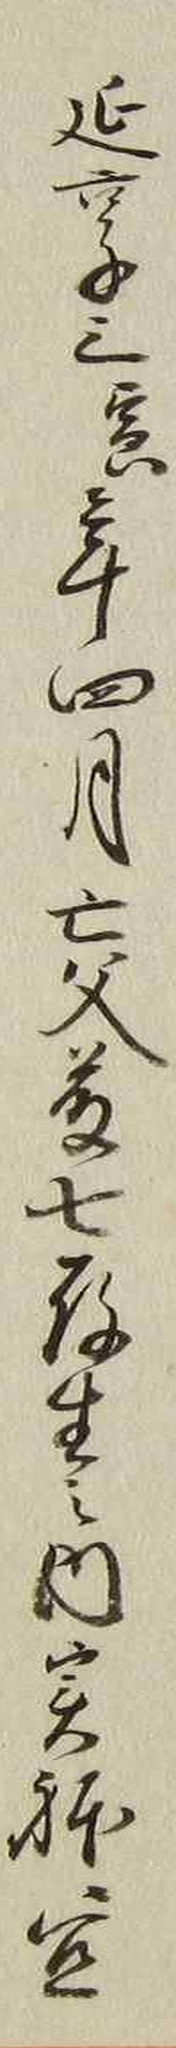一延享三寅年四月亡父藤七存生之内実体ニ宜
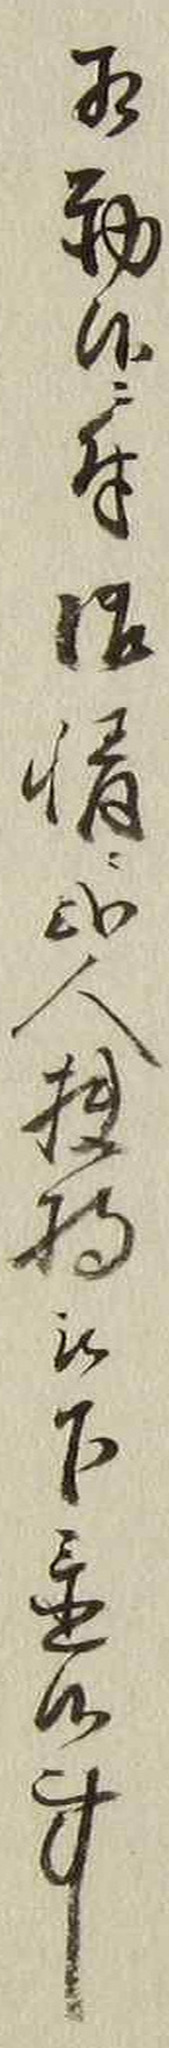相勤候ニ付御情ニ弐人扶持被下置候事
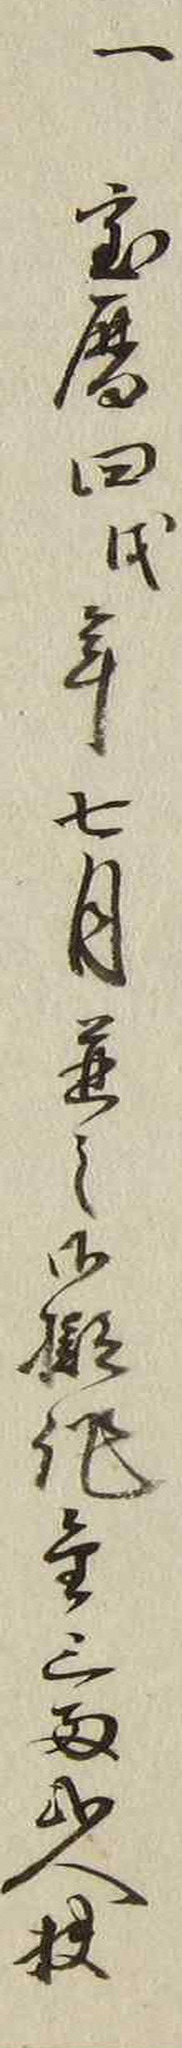一宝暦四戌年七月並之御擬作金三両弐人扶
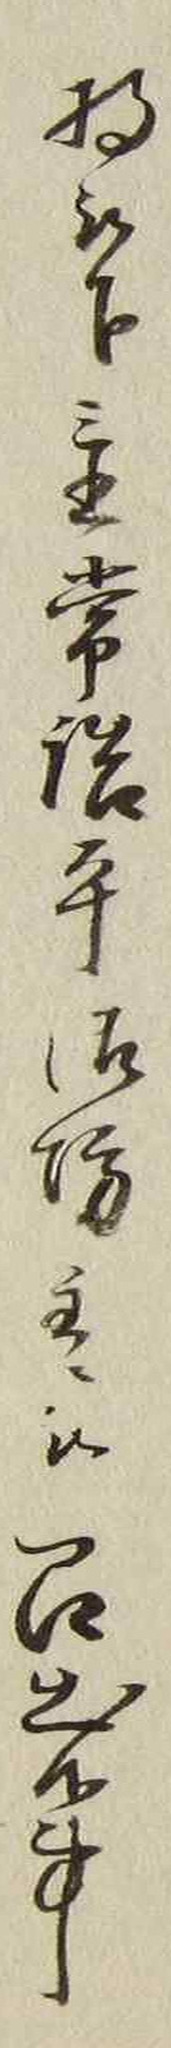持被下置常詰平御坊主ニ被召出候事
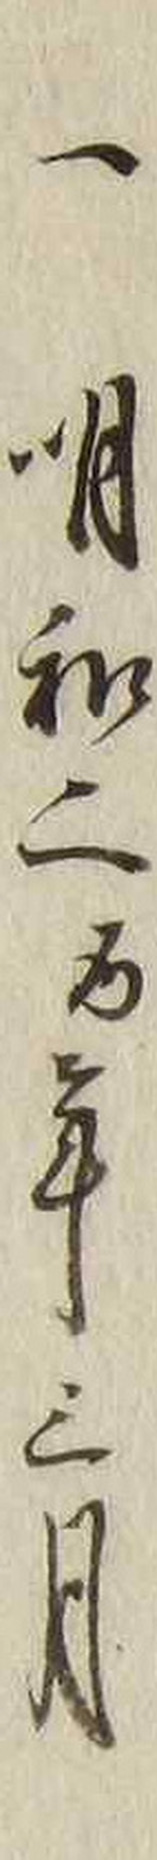一明和二酉年三月
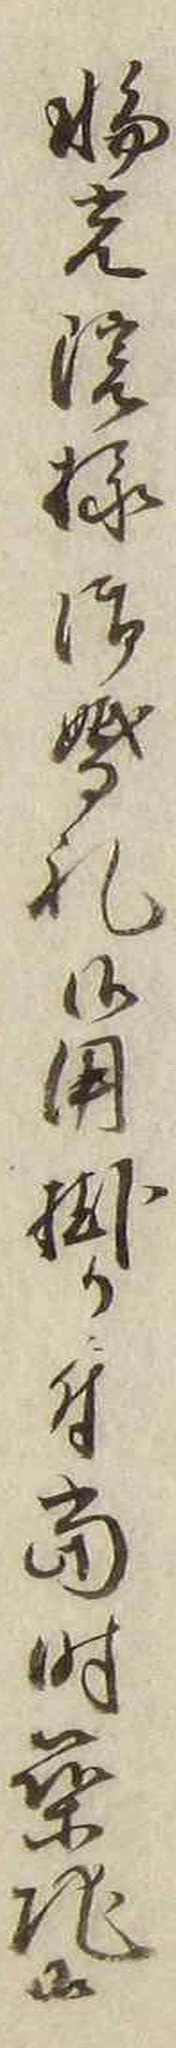輪光院様御婚礼御用掛りニ付当時築地御

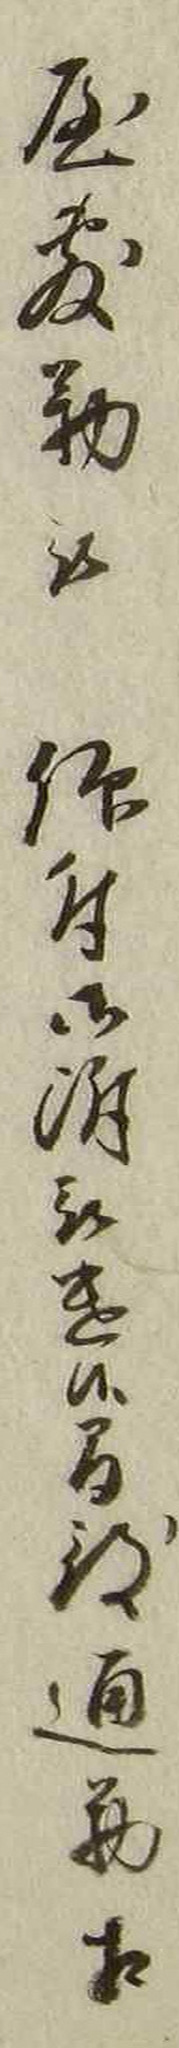屋敷勤被仰付御附被遣候間致通勤相
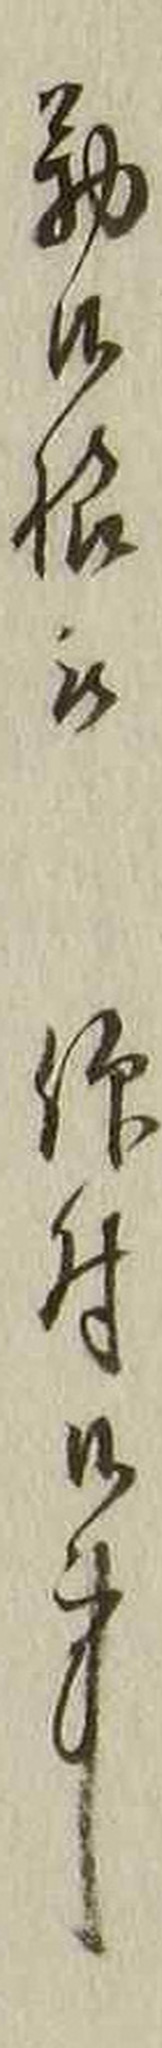勤候様被仰付候事
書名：諸士系譜　巻之132　た之部8
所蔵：会津若松市立会津図書館
